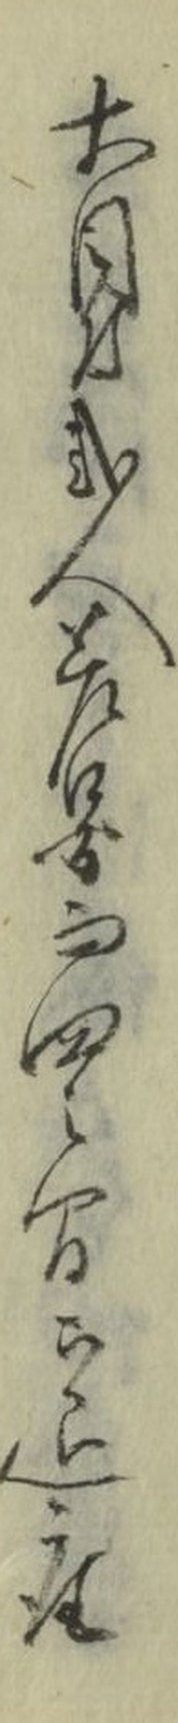大目付弐人差図而四之間え退座
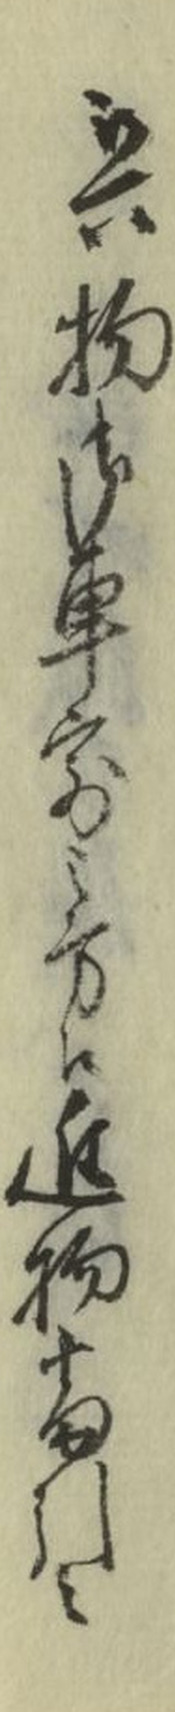被下物御車寄之方え進物番引之
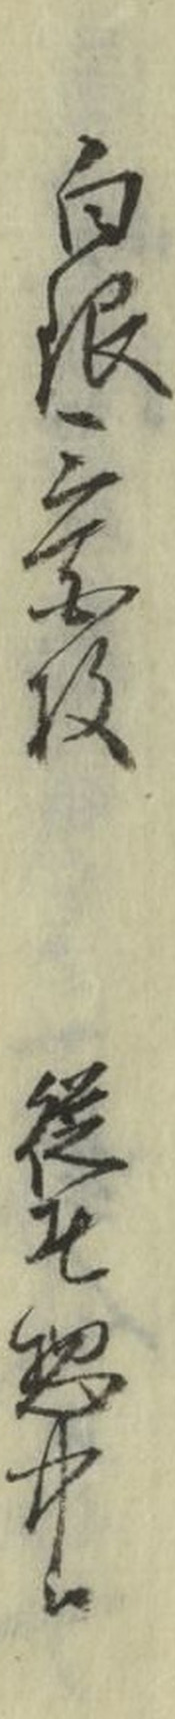白銀三百枚従者惣中え

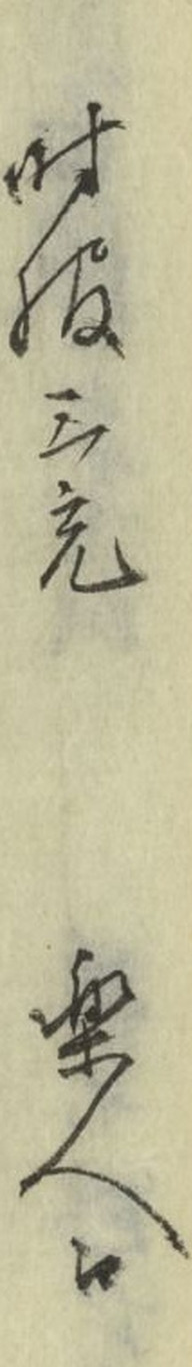時服三充楽人え
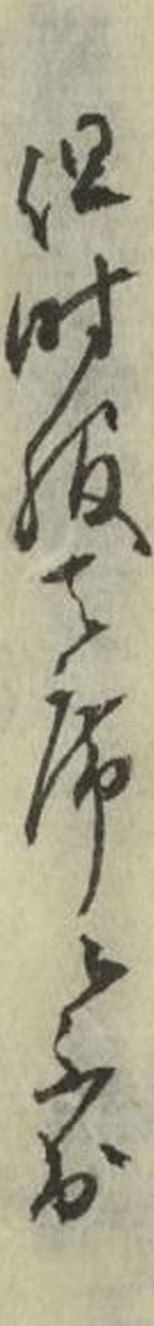但時服は席え不出
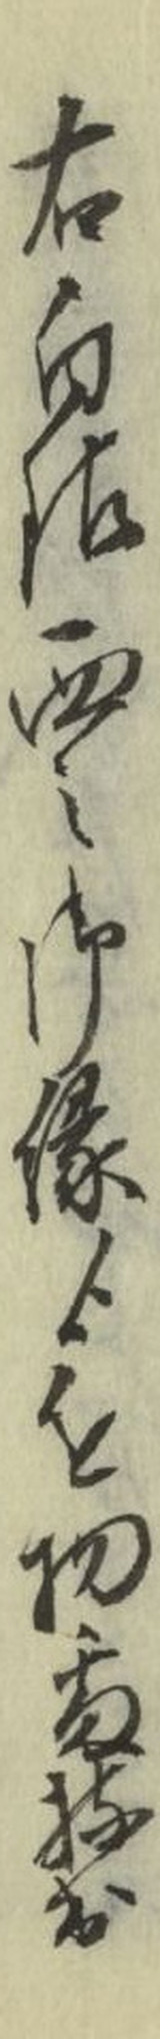右白銀西之御縁ゟ進物番持出
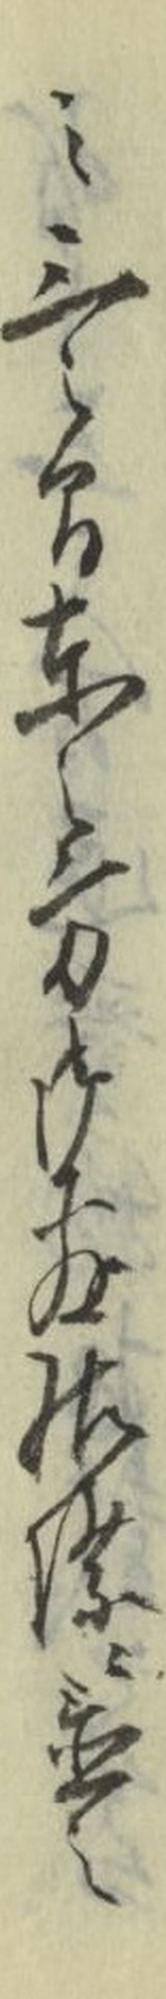之三之間東之方御敷居際に置之
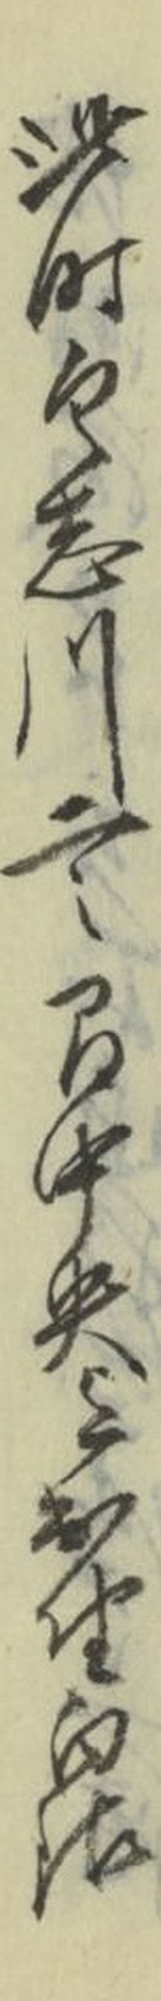此時具志川二之間中央迄出坐白銀
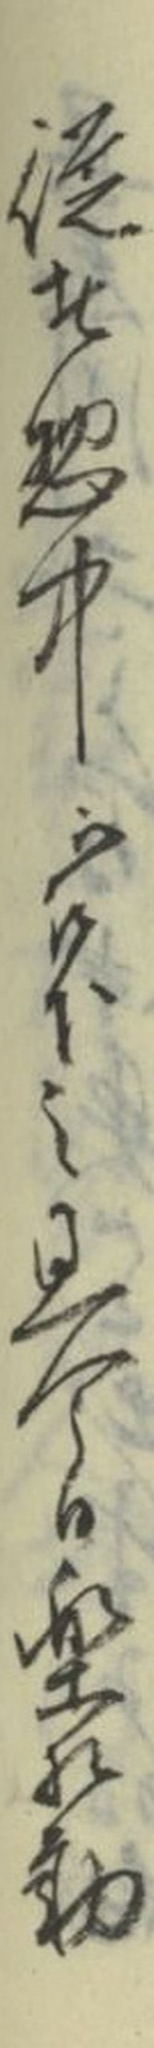従者惣中え被下之且今日楽相勤
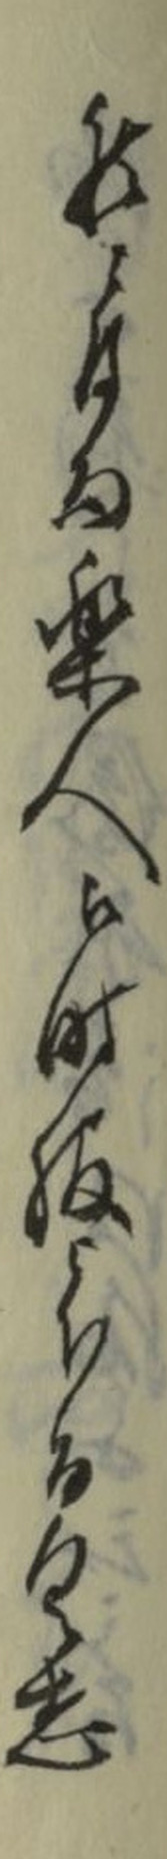候に付而楽人え時服被下旨具志
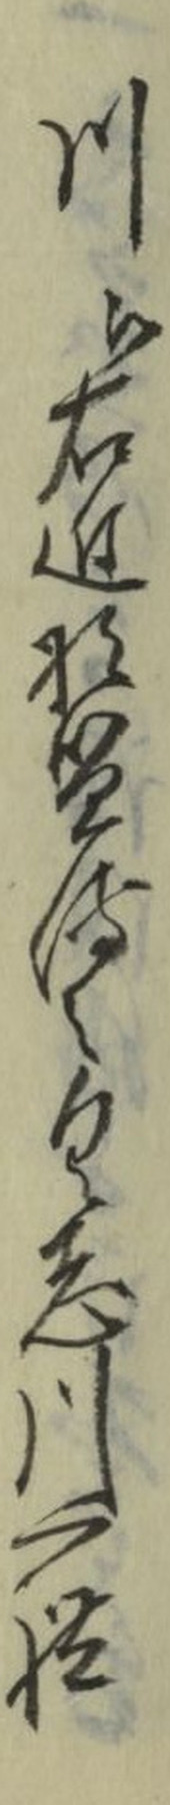川え右近将監伝之具志川一礼
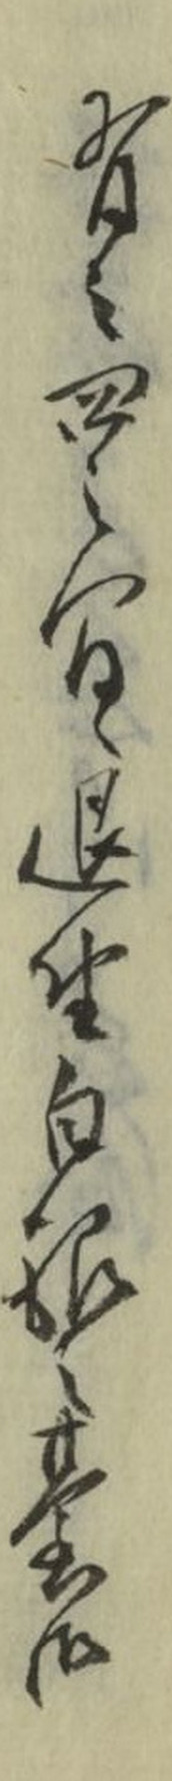有之四之間へ退坐白銀之台御
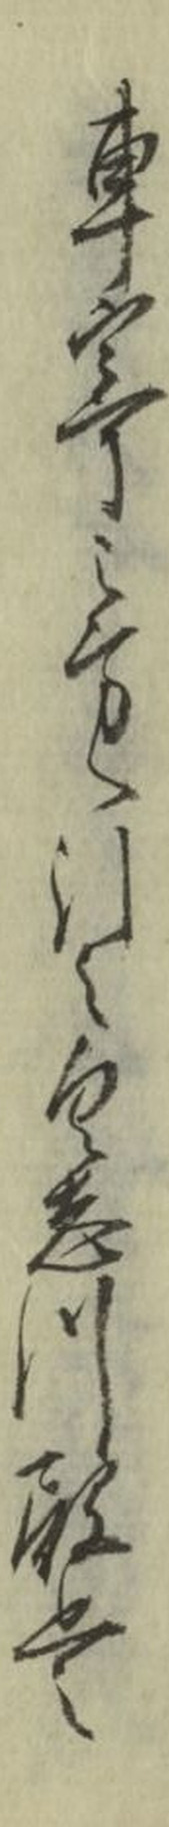車寄之方へ引之具志川殿上之
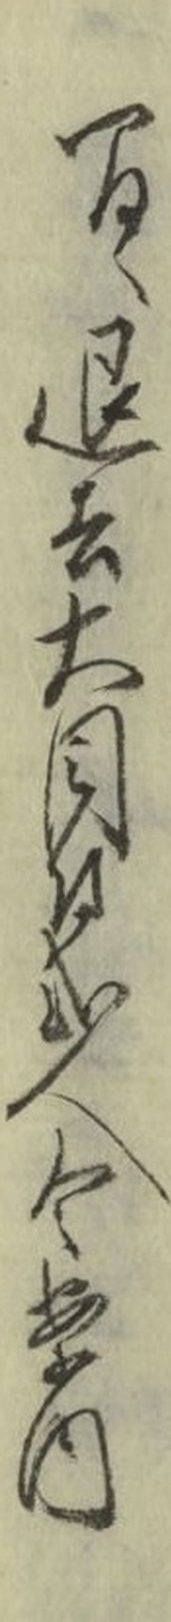間へ退去大目付弐人令案内
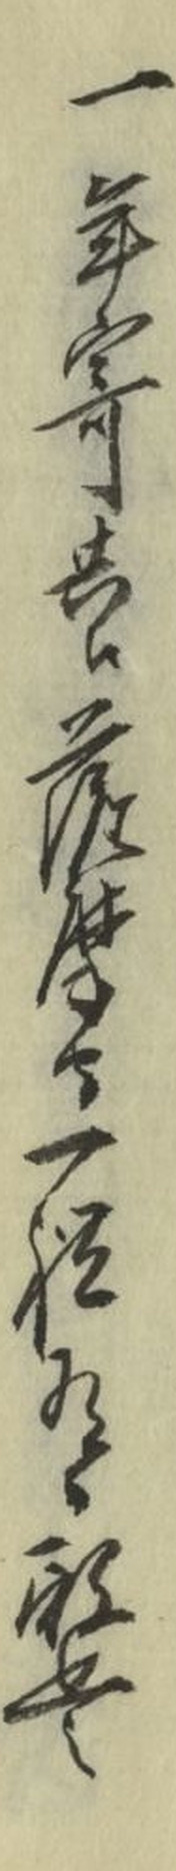一年寄共え薩摩守一礼有而殿上之

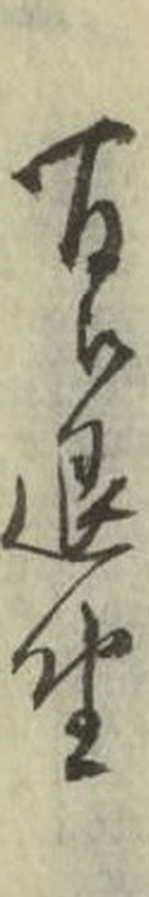間え退坐
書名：琉球人来朝記 四之五
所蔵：University of the Ryukyus Library
